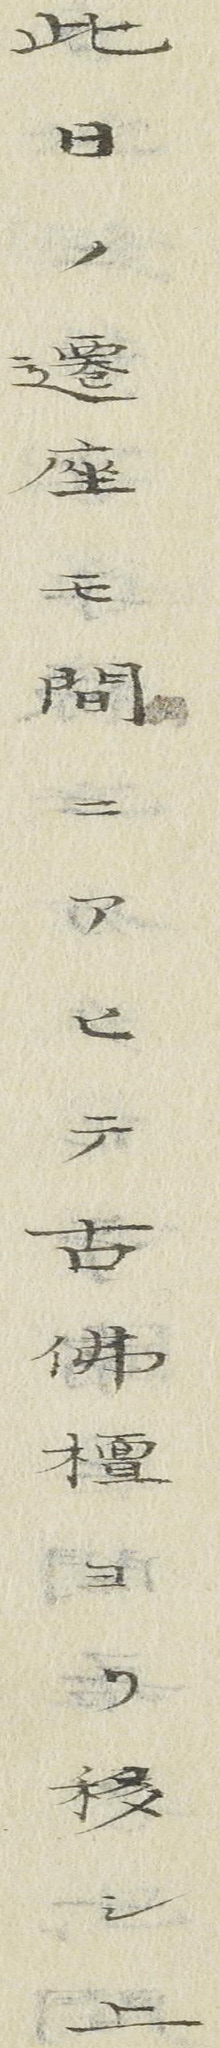此日ノ遷座モ間ニアヒテ古仏檀ヨリ移シ上
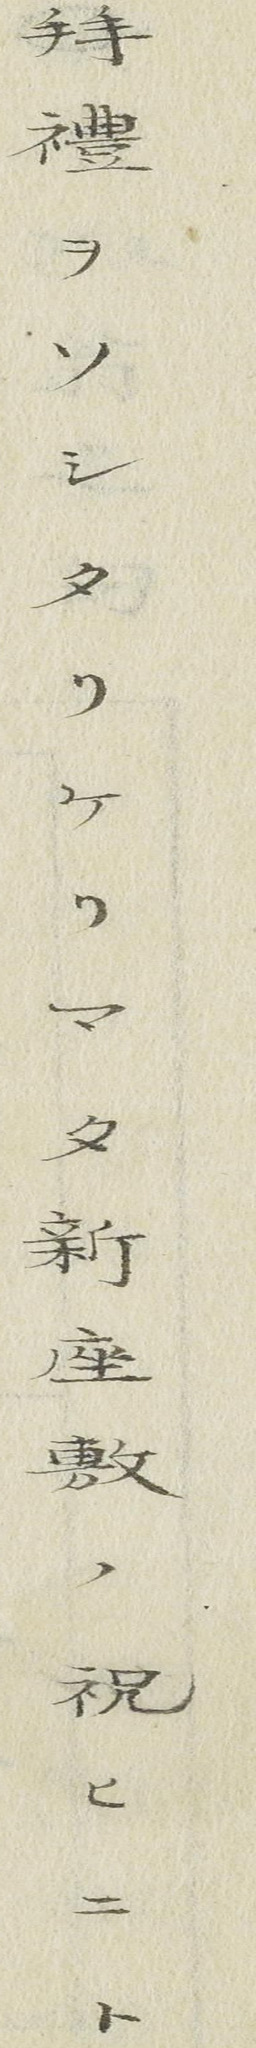拝礼ヲソシタリケリマタ新座敷ノ祝ヒニト
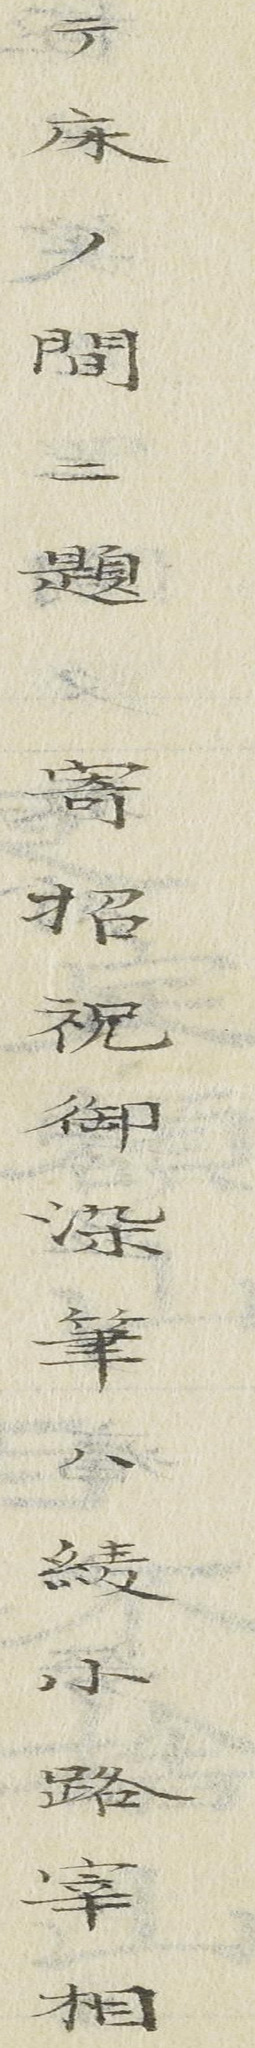テ床ノ間ニ題寄招祝御染筆ハ綾小路宰相
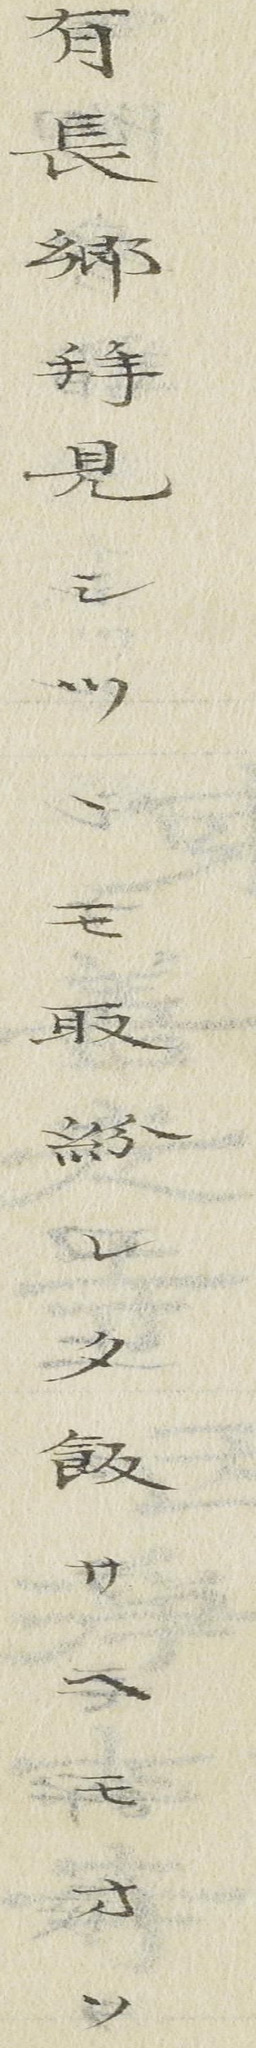有長郷拝見シツヽモ取紛レタ飯サヘモオソ
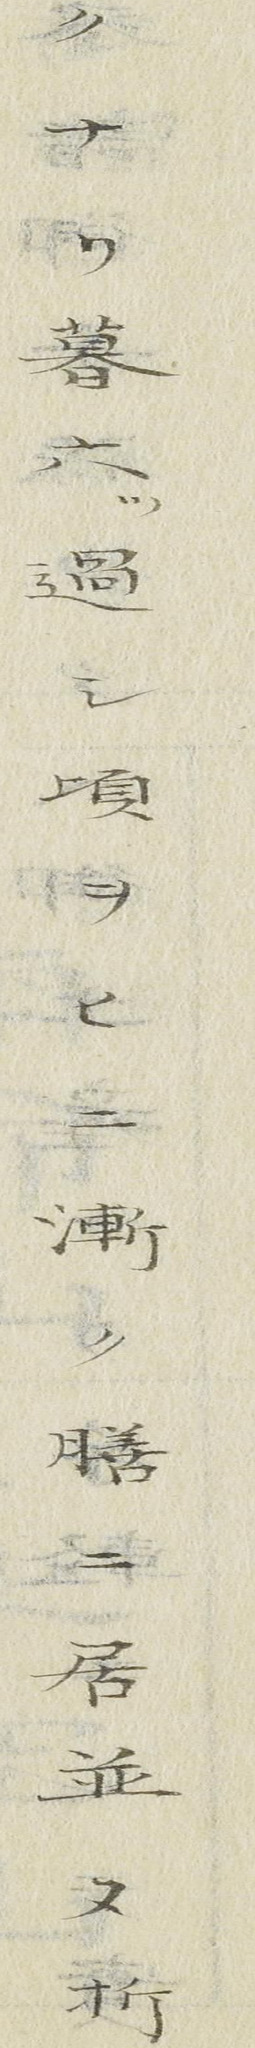クナリ暮六ツ過シ頃ヲヒニ漸ク膳ニ居並ヌ折
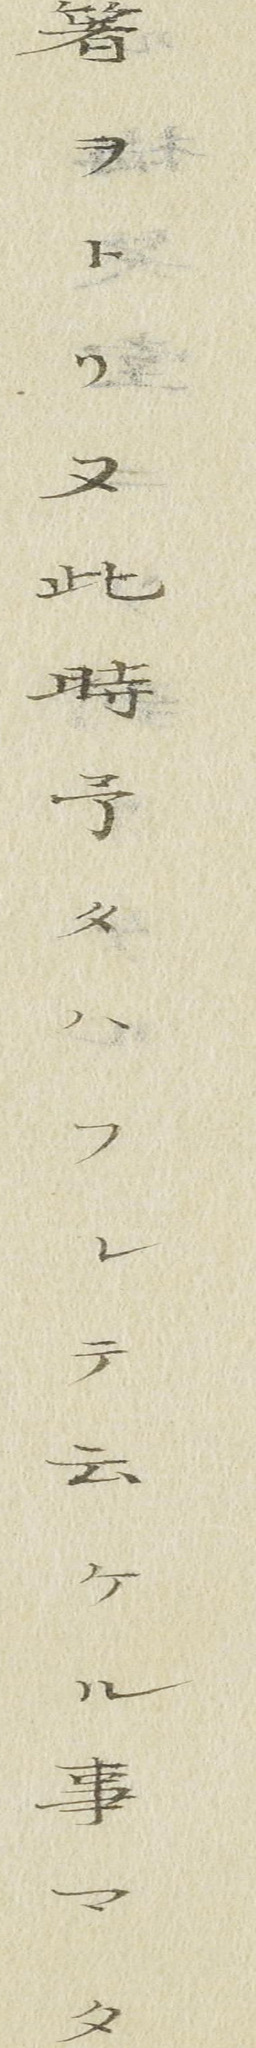箸ヲトリヌ此時予タハフレテ云ケル事マタ
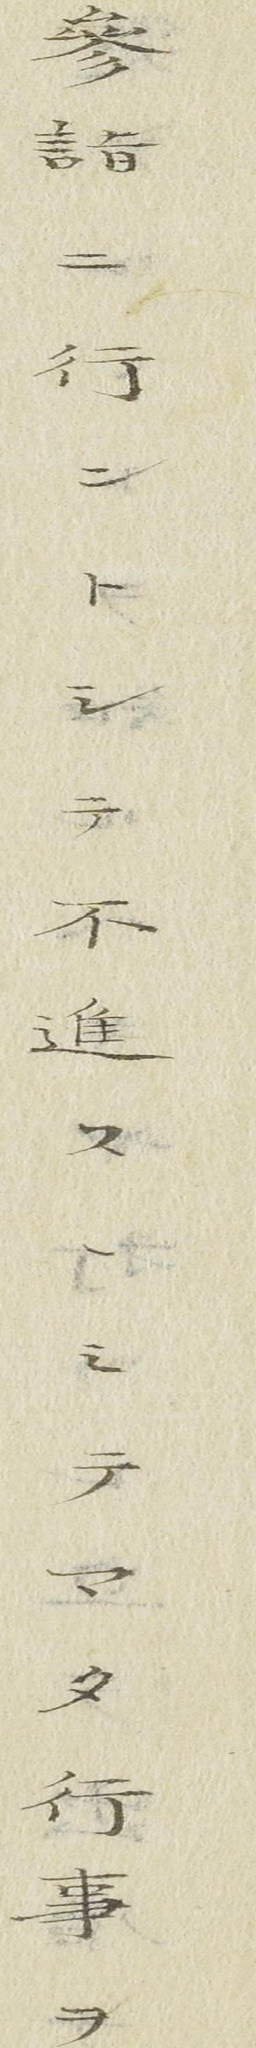参詣ニ行ントシテ不進スヽミテマタ行事ヲ
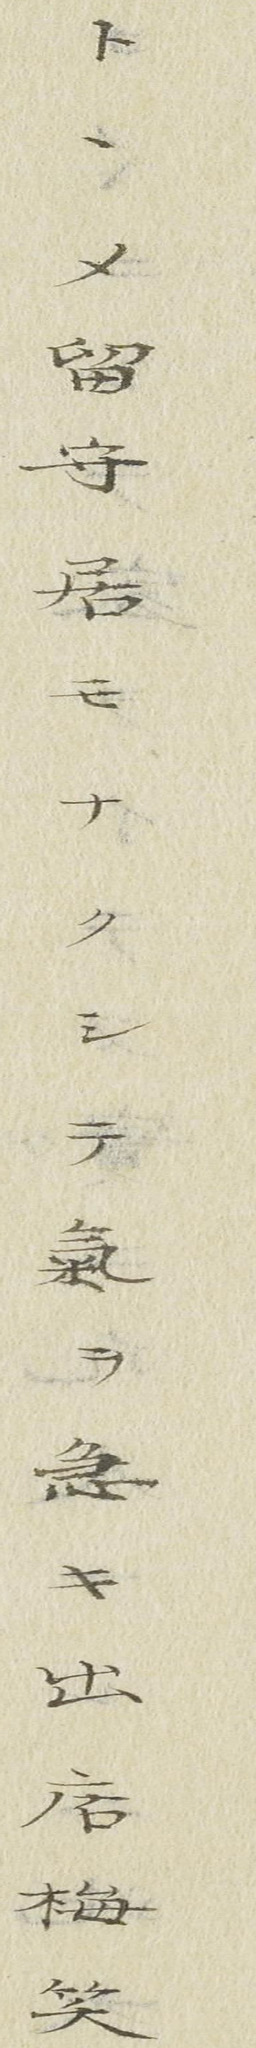トヽメ留守居モナクシテ気ヲ急キ出店梅笑
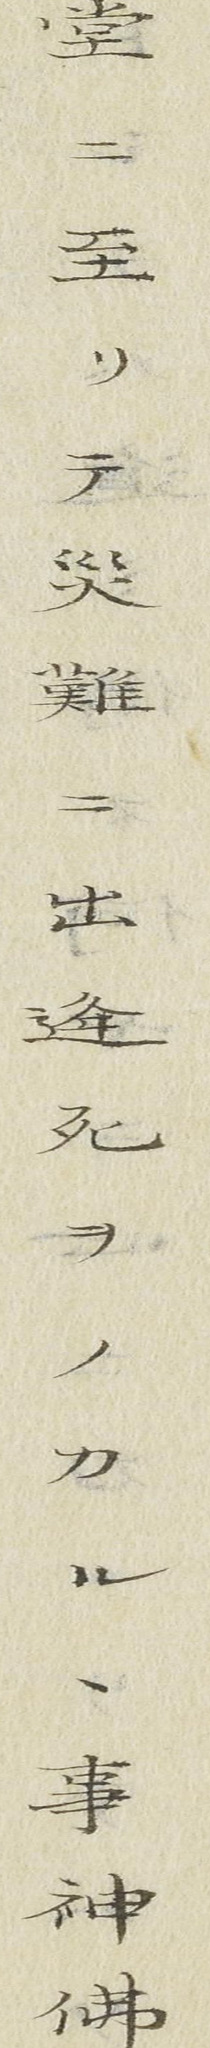堂ニ至リテ災難ニ出逢死ヲノカルヽ事神仏
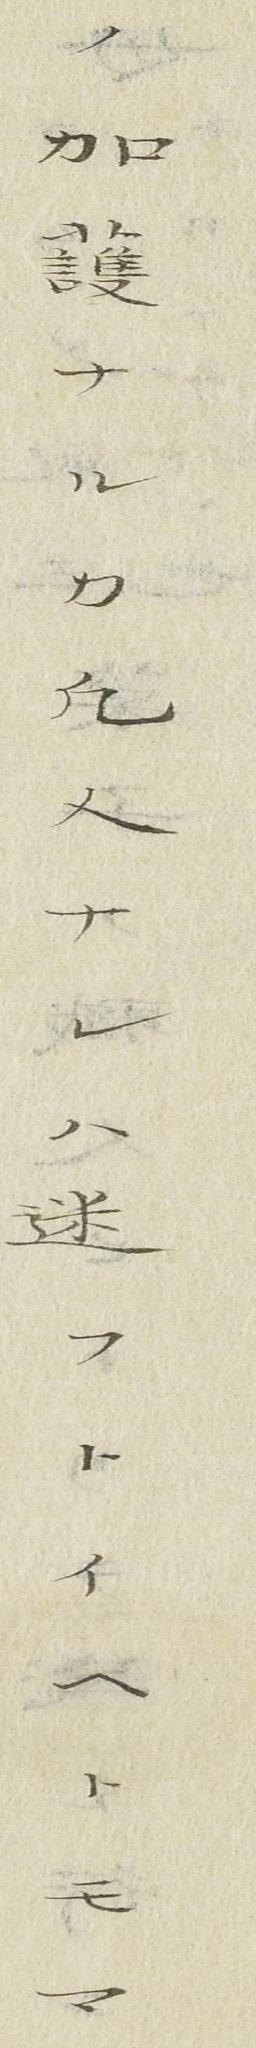ノ加護ナルカ凡人ナレハ迷フトイヘトモマ
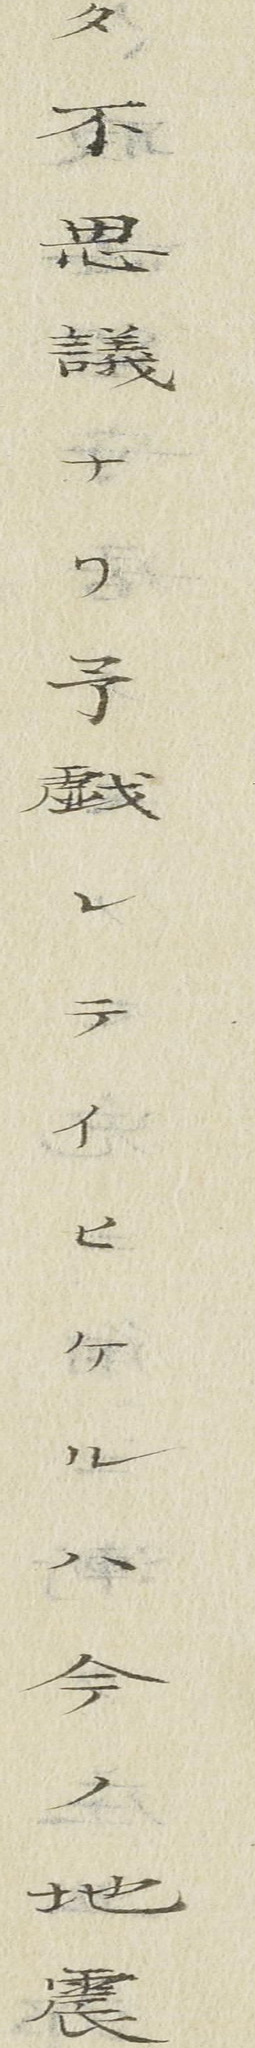タ不思議ナリ予戯レテイヒケルハ今ノ地震
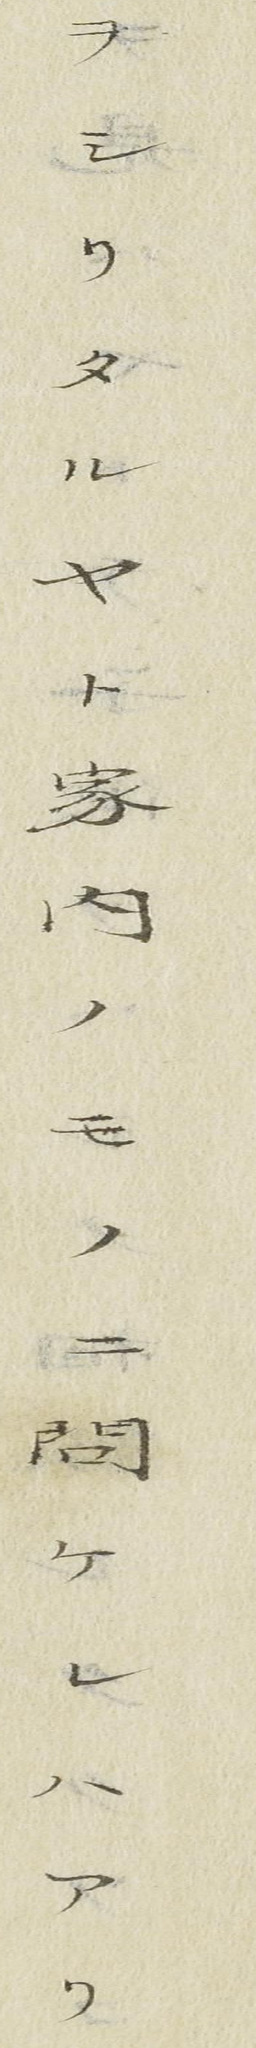ヲシリタルヤト家内ノモノニ問ケレハアリ
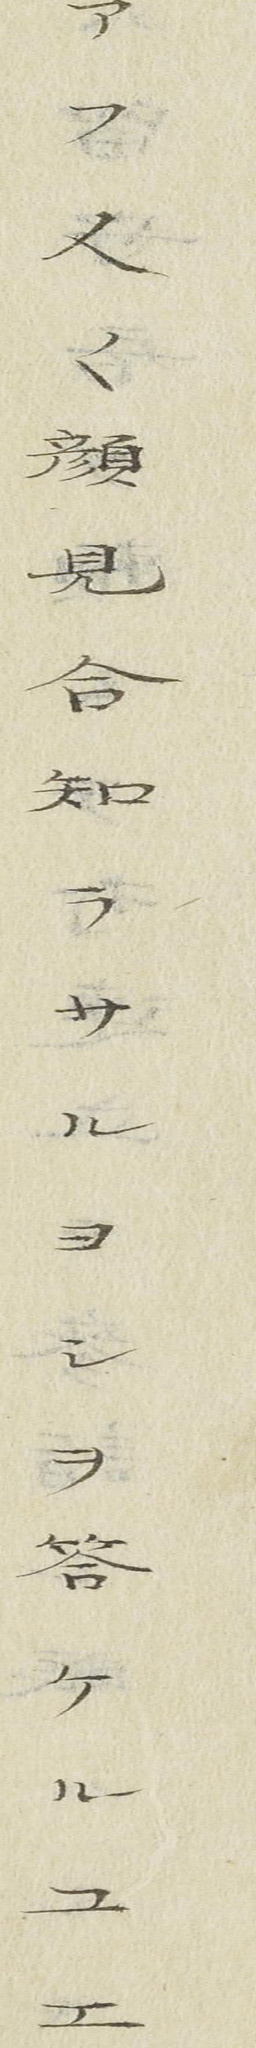アフ人〱顔見合知ラサルヨシヲ答ケルユエ
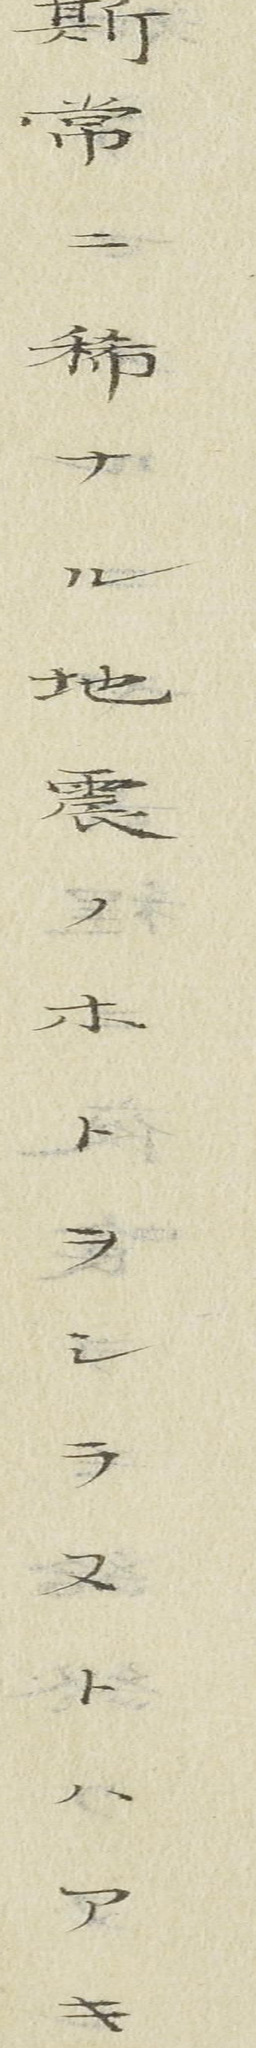斯常ニ稀ナル地震ノホトヲシラヌトハアキ
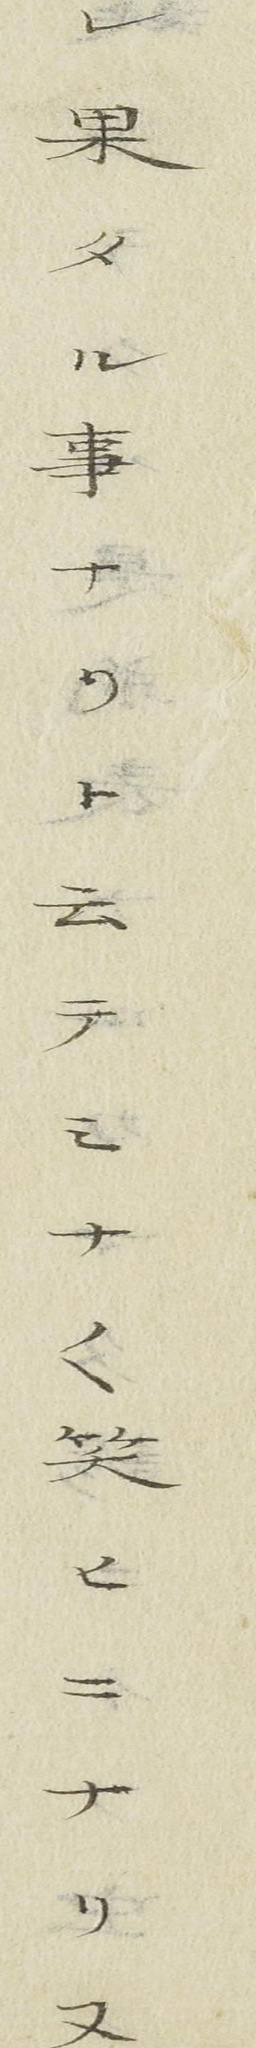レ果タル事ナリト云テミナ〱笑ヒニナリヌ

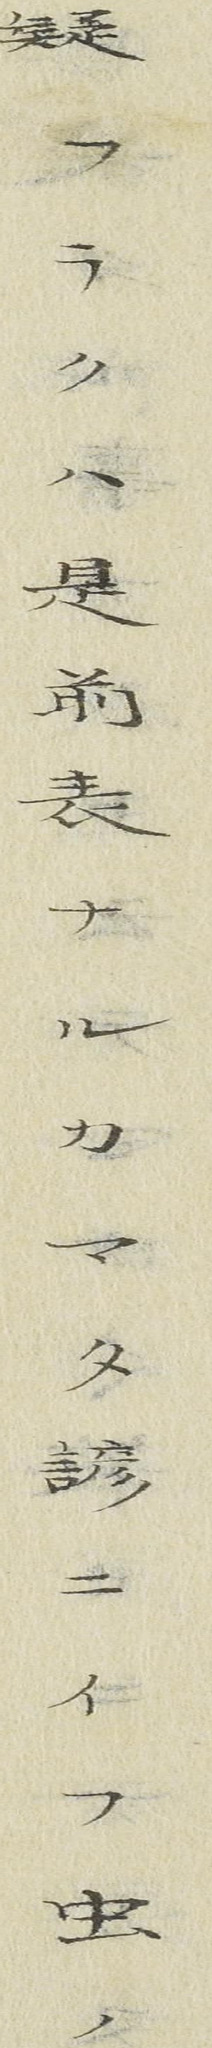疑フラクハ是前表ナルカマタ諺ニイフ虫ノ
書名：地災撮要　地震之部　巻ノ二
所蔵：東京大学地震研究所図書室 Earthquake Research Institute Library, The University of Tokyo, JAPAN
